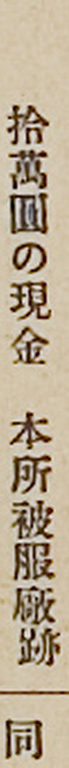同拾万円の現金本所被服廠跡
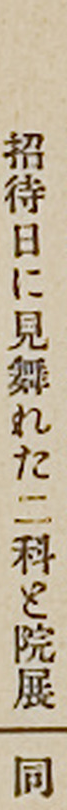同招待日に見舞れた二科と院展
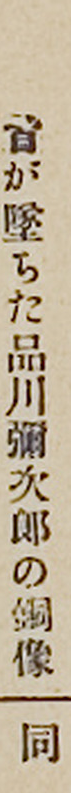同首が落ちた品川弥次郎の銅像
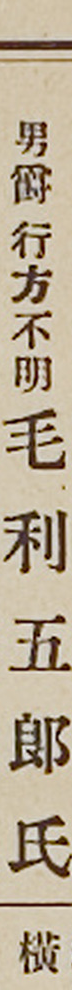男爵行方不明毛利五郎氏
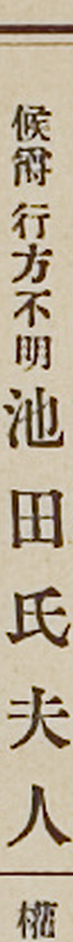侯爵行方不明池田氏夫人
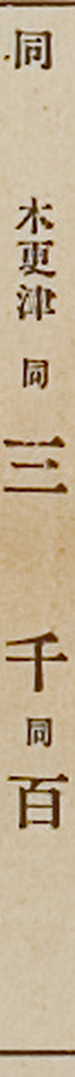同木更津同三千同百
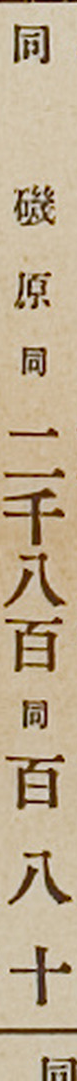同磯原同二千八百同百八十
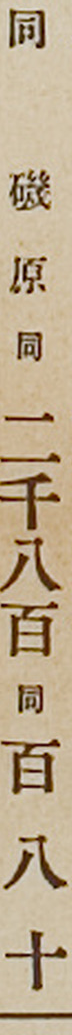同磯原同二千八百同百八十
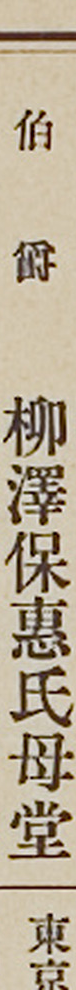伯爵柳沢保恵氏母堂
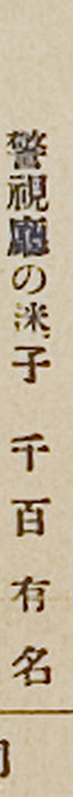同警視庁の迷子千百有名
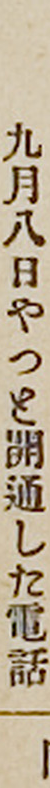同九月八日やつと開通した電話
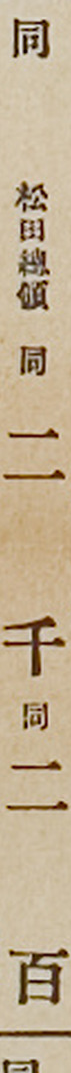同松田同二千同二百
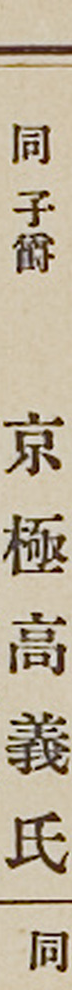同子爵京極高義氏
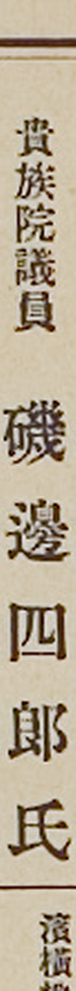貴族院議員磯辺四郎氏
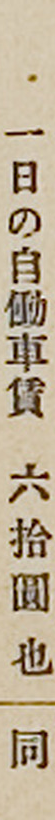同一日の自働車賃六拾円也
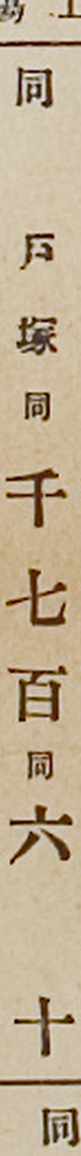同戸塚同千七百同六十
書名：関東大震災大見立一覧表
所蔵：東京大学総合図書館 General Library in the University of Tokyo, JAPAN
